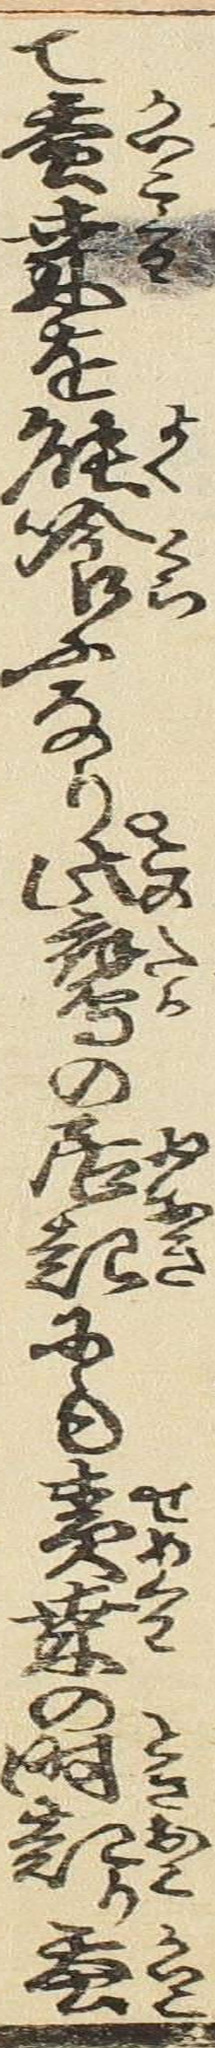て蚕桑を能喰ふなり。此鷹の居起にも責桑の時起り蚕
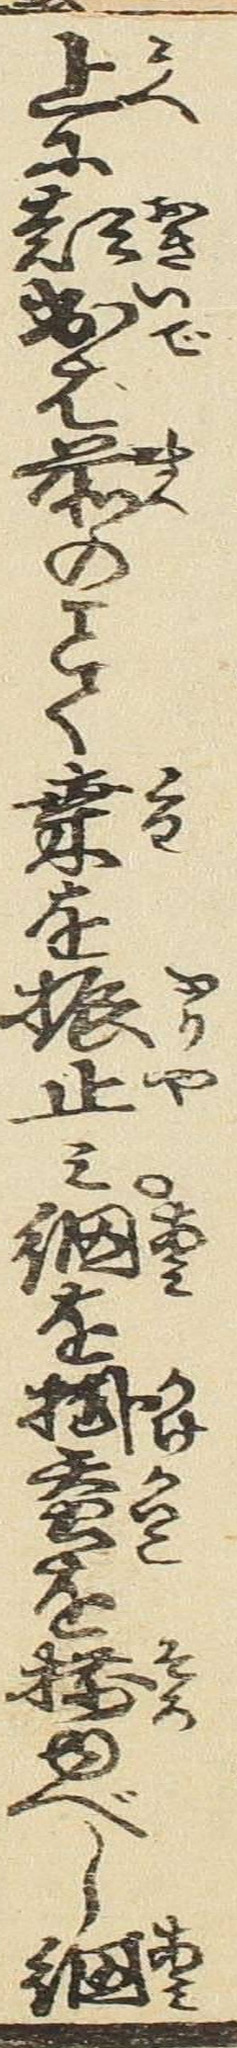上に起出は前のことく桑を振止み。網を掛蚕を揃ゆべし網
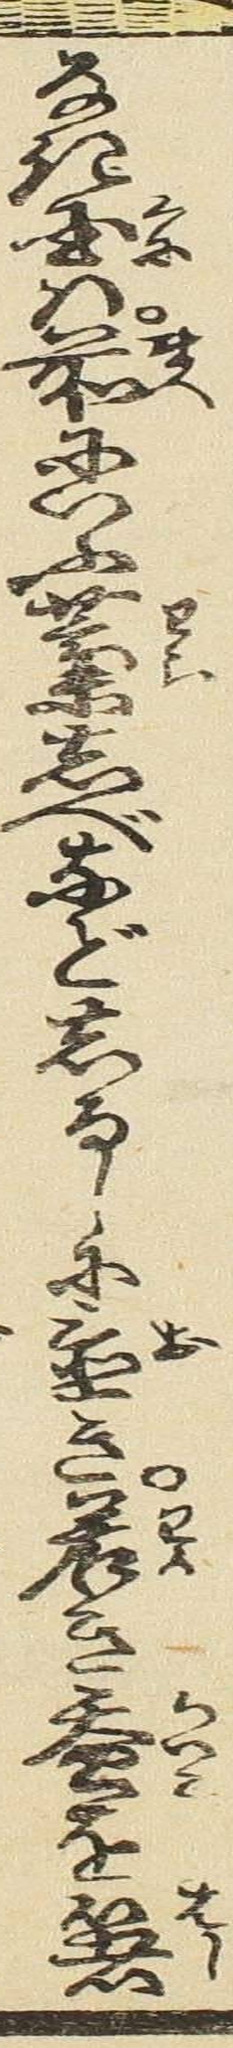なき国は。前にいふ藁しべなどしるしに置き。若き蚕を箸
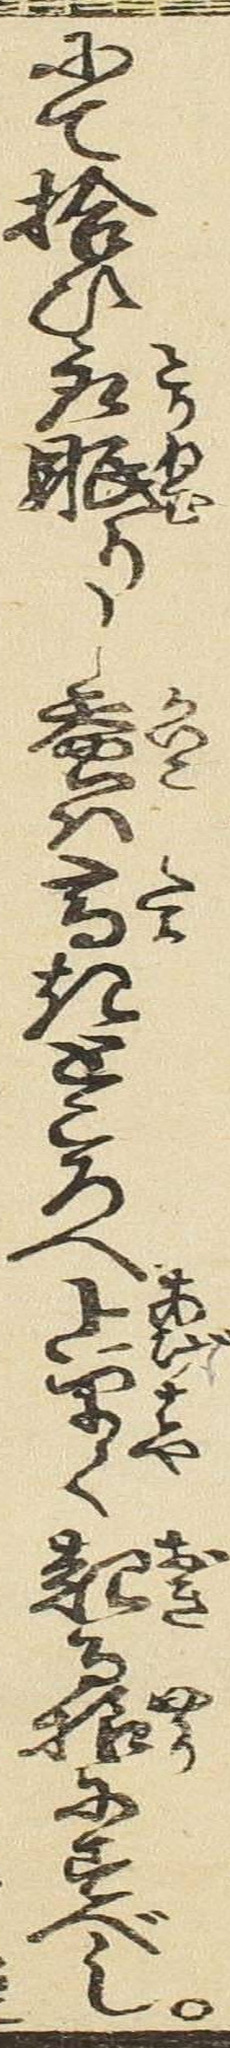にて拾ひ取眠りし蚕は高きところへ上早く起る様にすべし。
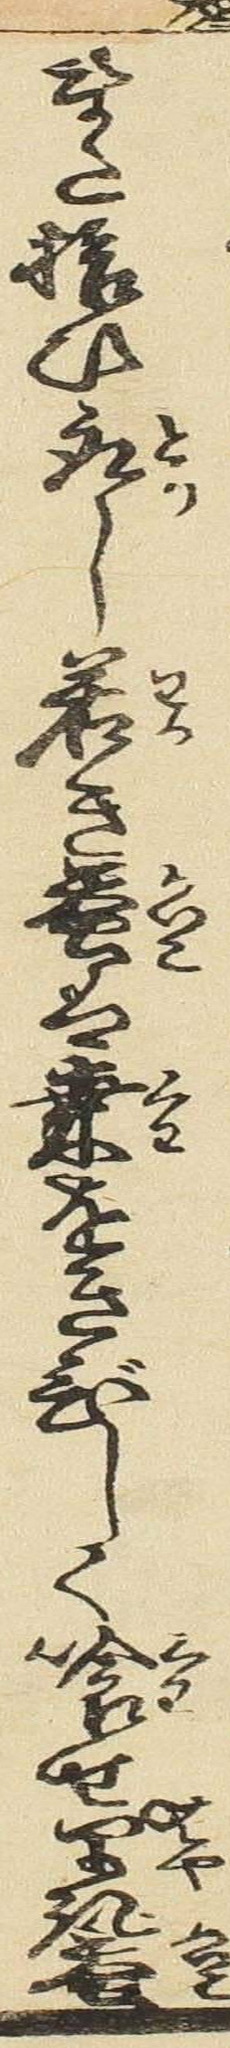また拾ひ取し若き蚕は桑をきびしく喰せ。早き蚕
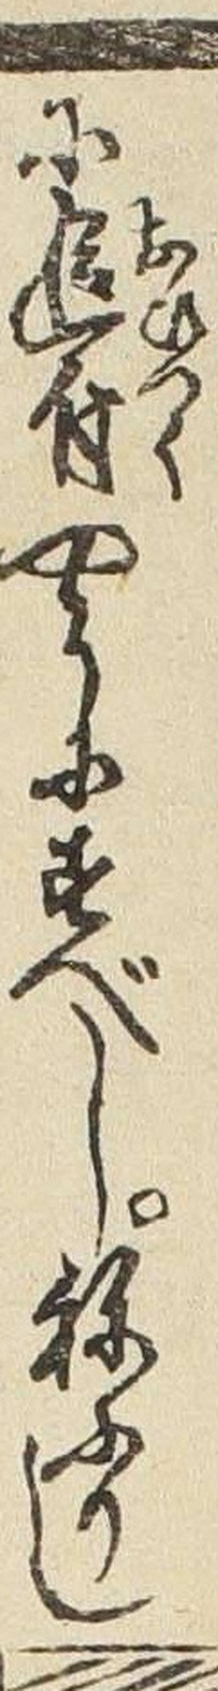に追付やうにすべし。ねふりし
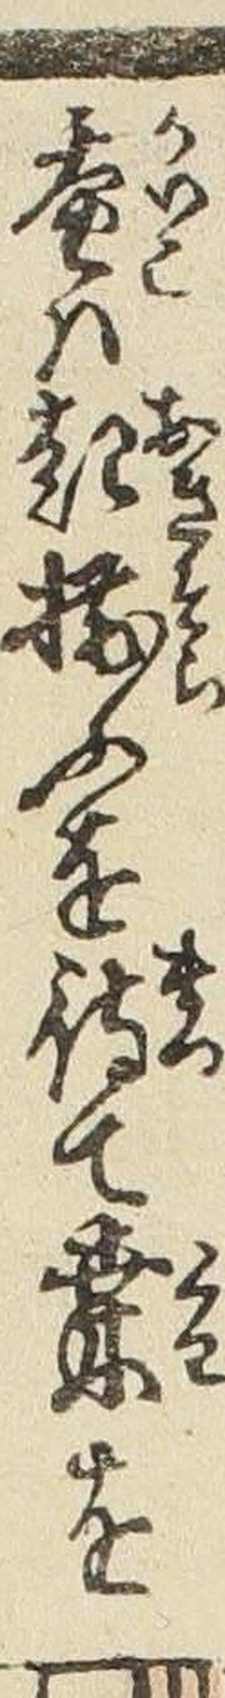蚕は起揃ふを待て桑を
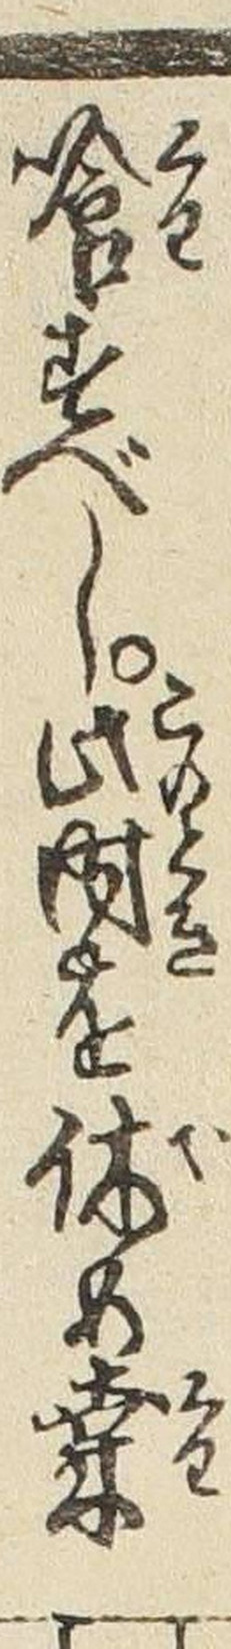喰すべし。此時を休め桑
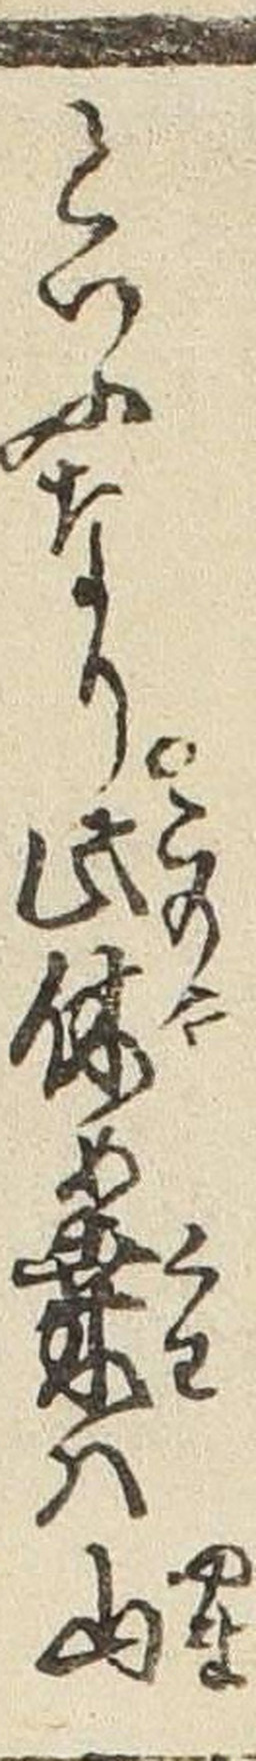といふなり。此休め桑は山
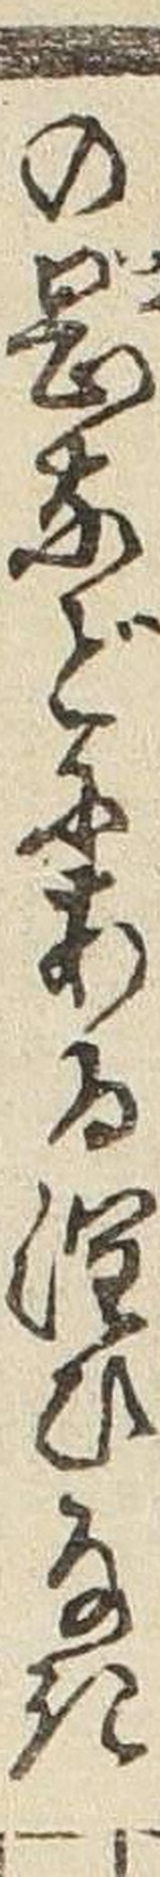の岡などにある潤ひなき
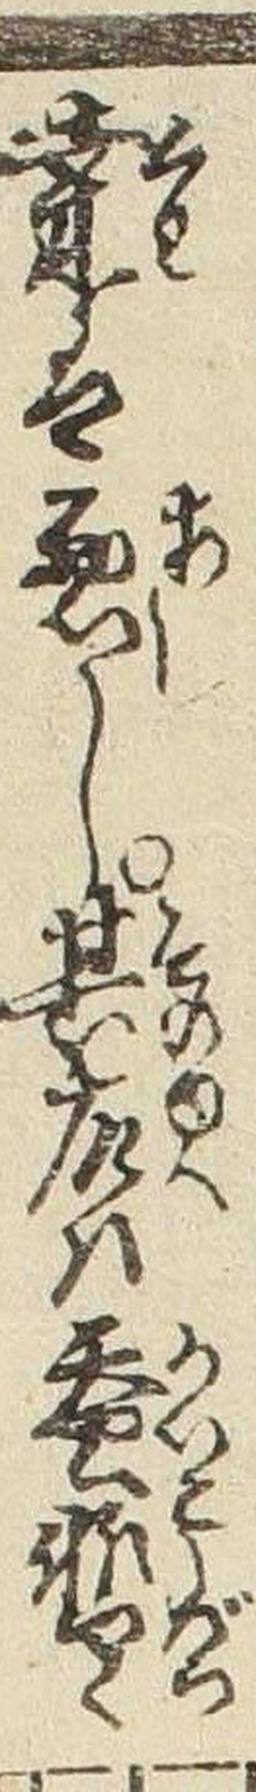桑は悪し。其故は蚕暫く
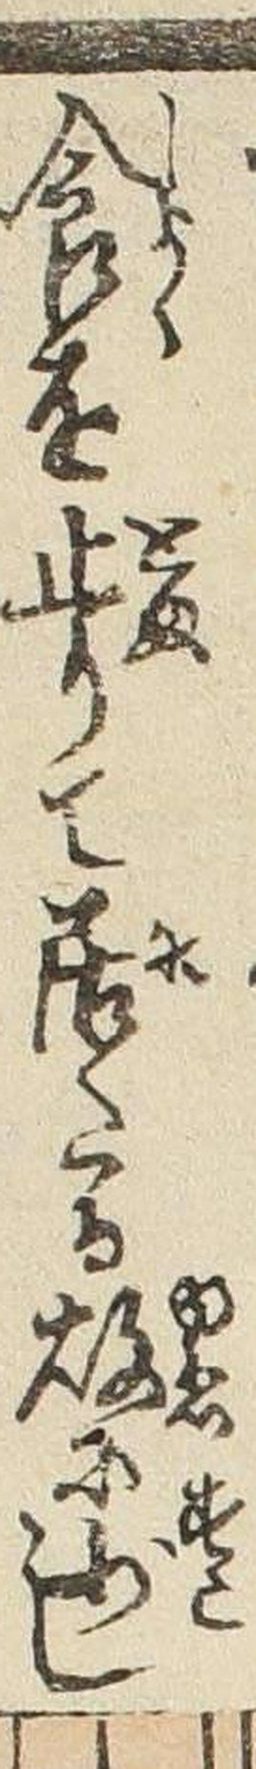食を止りて居たる故に少し
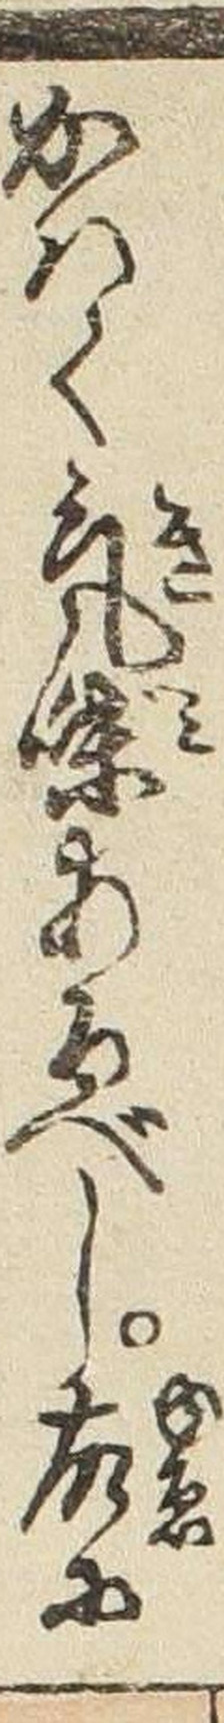かはく気味あるべし。故に
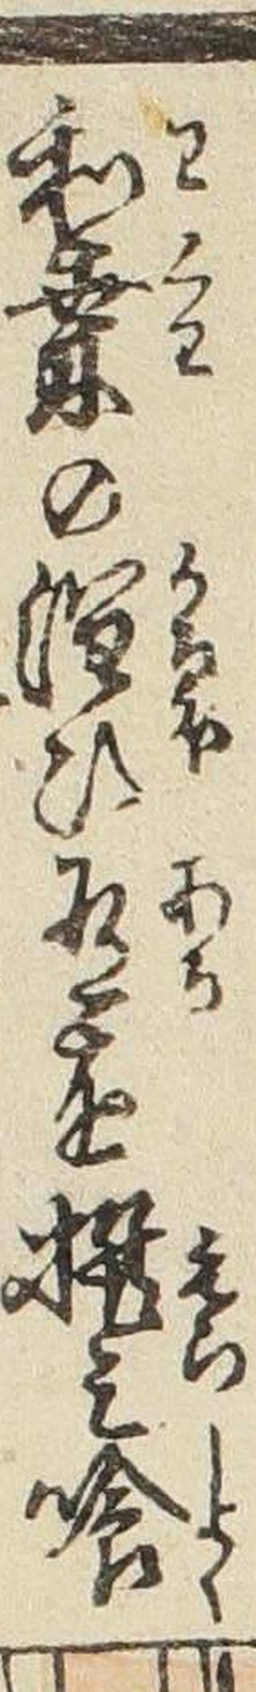和桑の潤ひ有を撰み喰
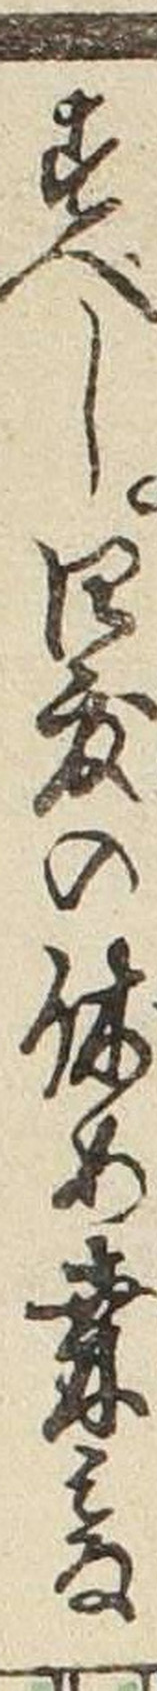すべし。四度の休め桑みな
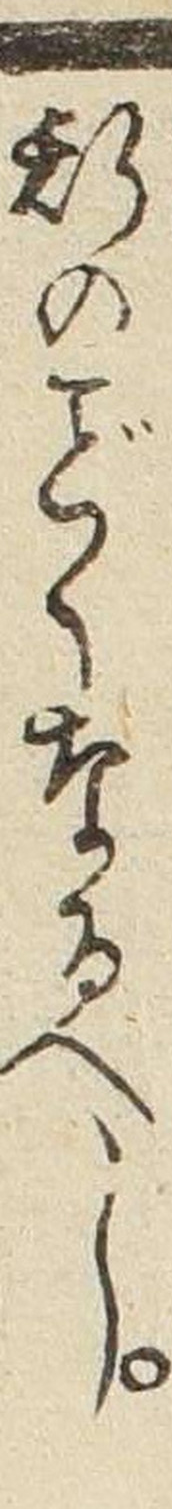斯のごとくなるへし。
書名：養蠶圖解
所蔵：東京大学農学生命科学図書館 国文学研究資料館
